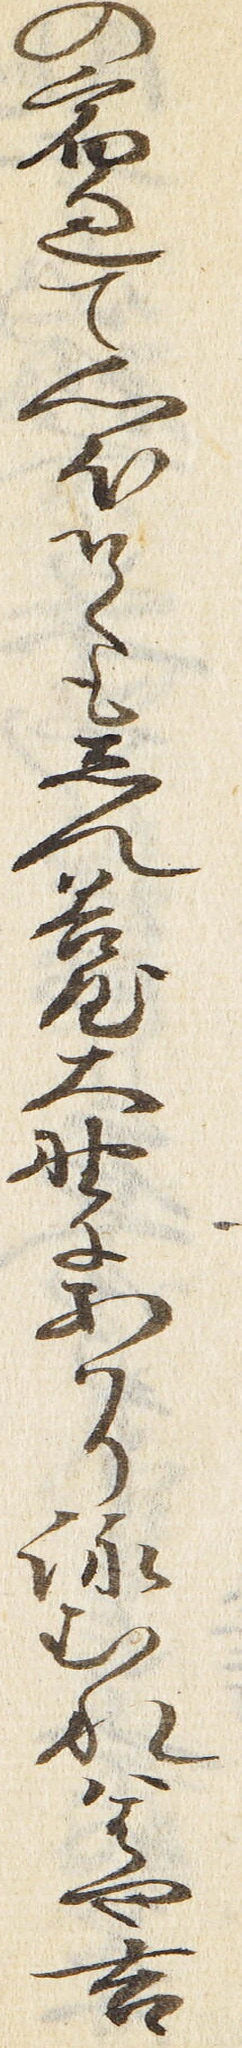の宿過て心ほそくもしん谷屋大野にあかり詠むれははや吉
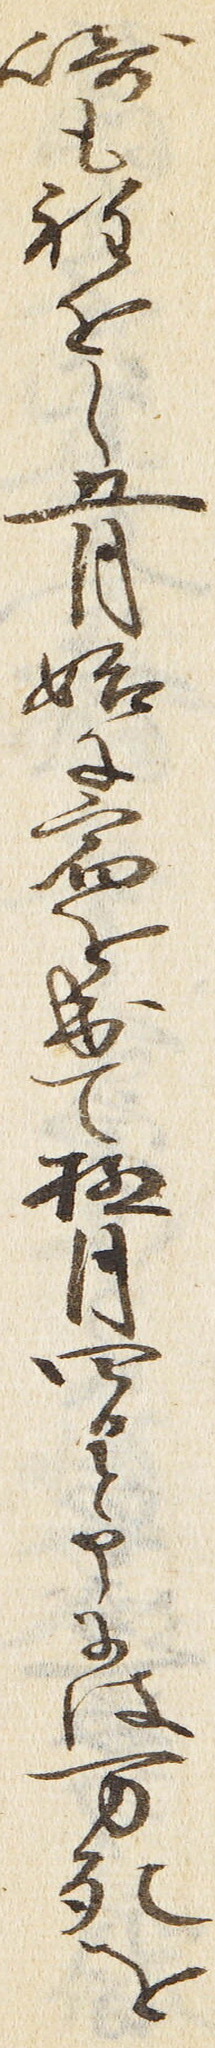崎も程近し五月始に宿を出て極月四日と申には万死を
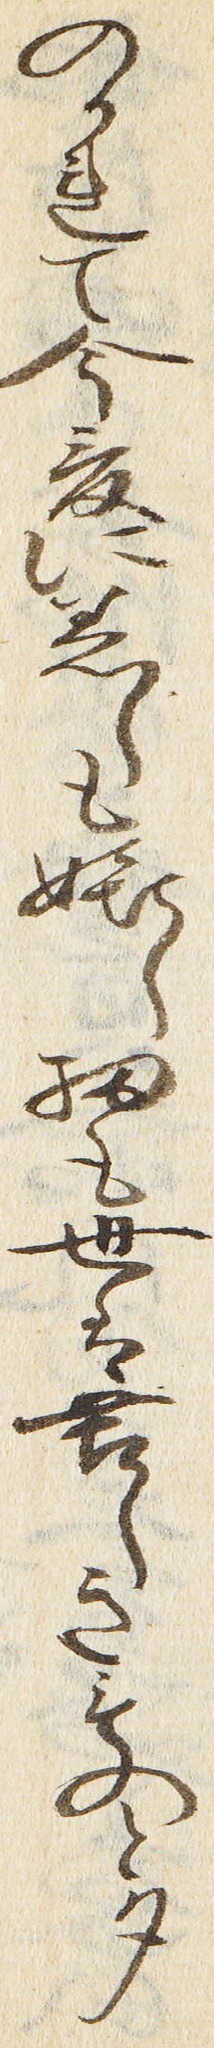のかれて今爰に着しも嬉し扨も世は苦しきものと夕
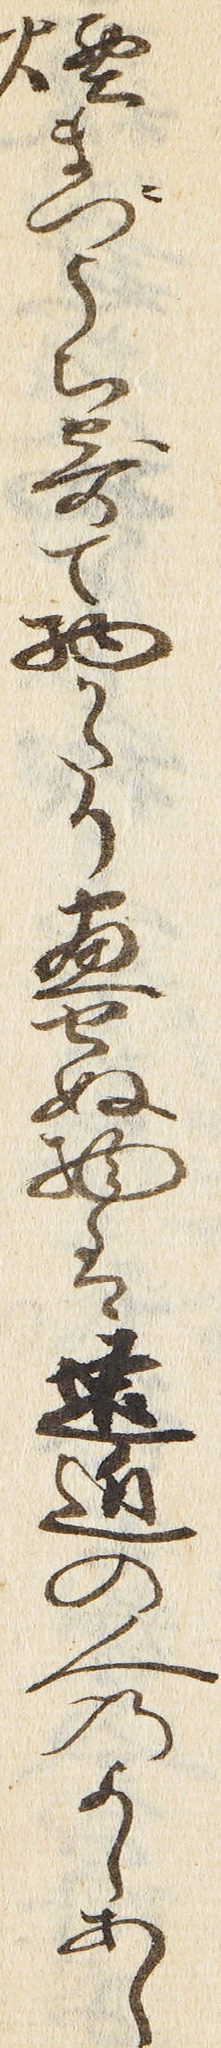煙まづうち寄て物かたり尽せぬ物は遠近の人のよしあし
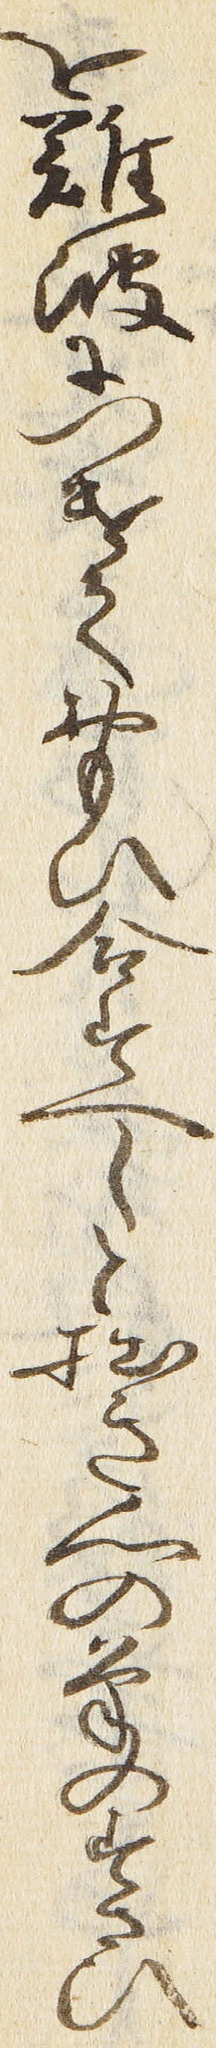を難波につけておもひ合すへしと拙き心の筆のすさひ
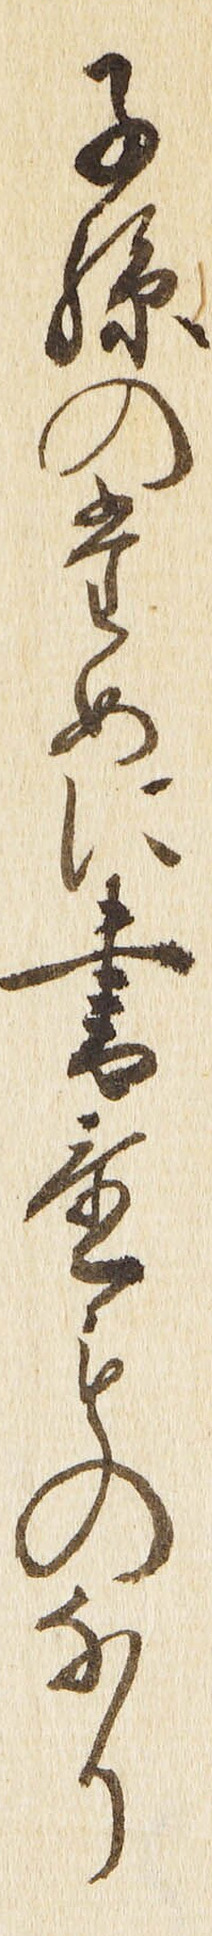子孫のために書置ものなり
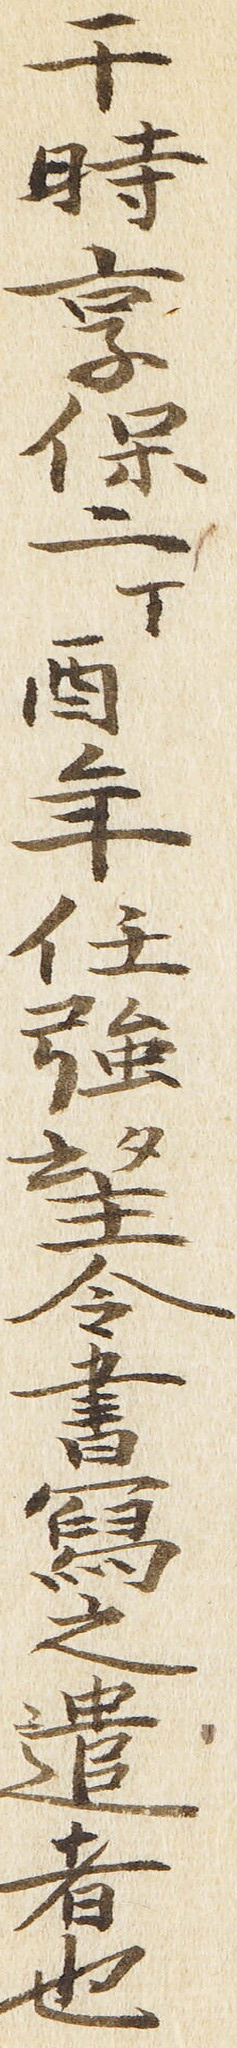于時享保二丁酉年任強望令書写之遣者也
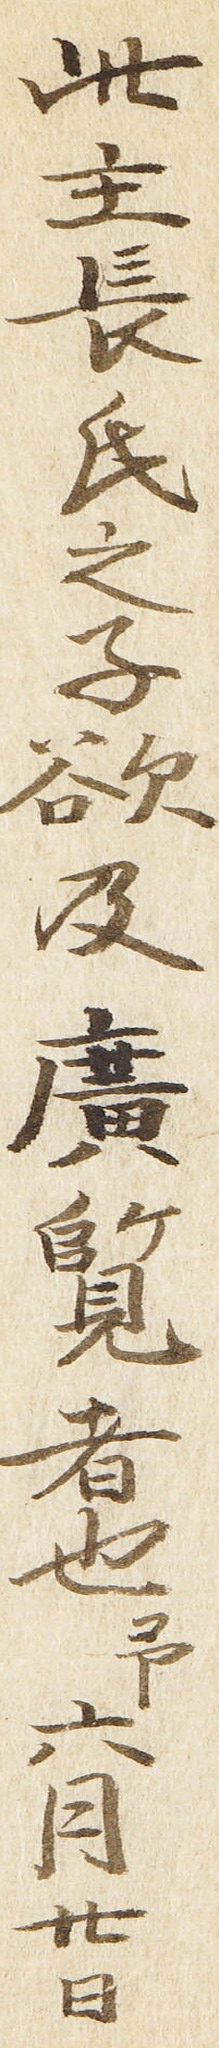此主長氏之子欲及広覧者也予六月廿日
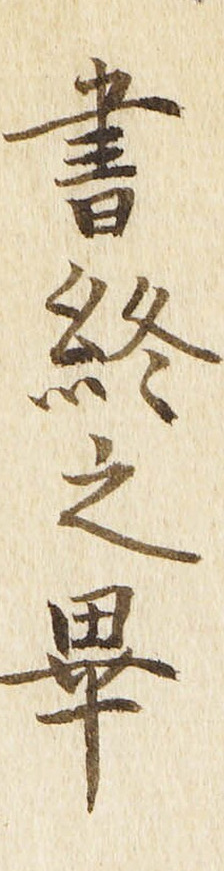書終之畢
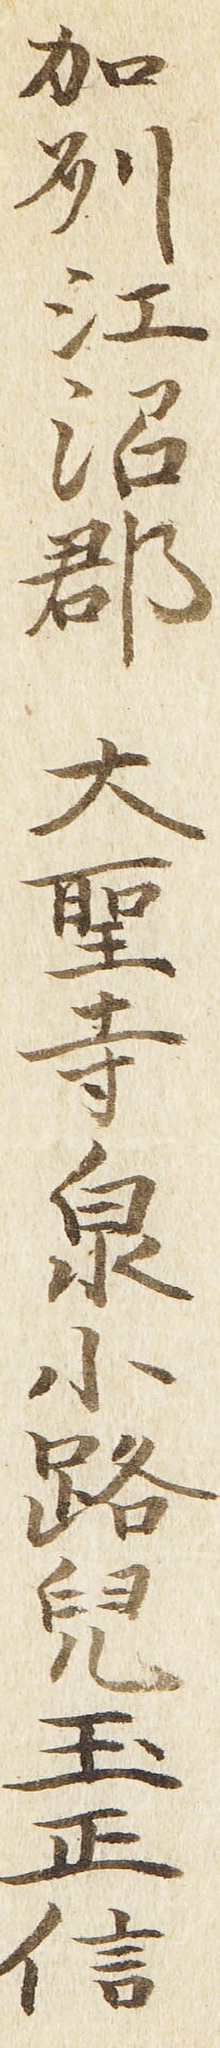加州江沼郡大聖寺泉小路児玉正信
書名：海陸世話日記
